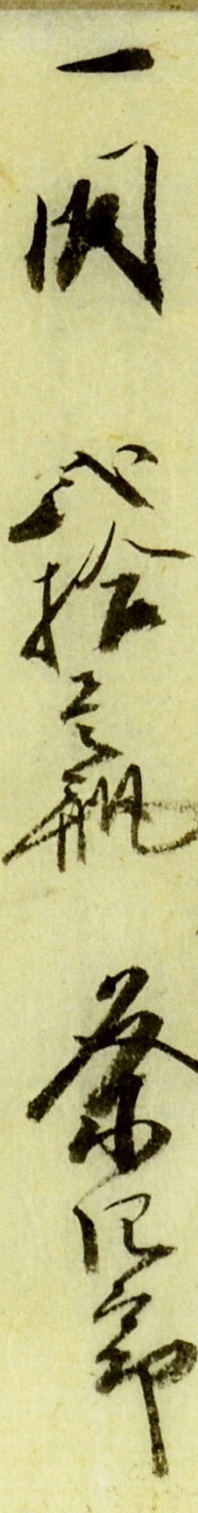一同弐拾壱瓶粂四郎
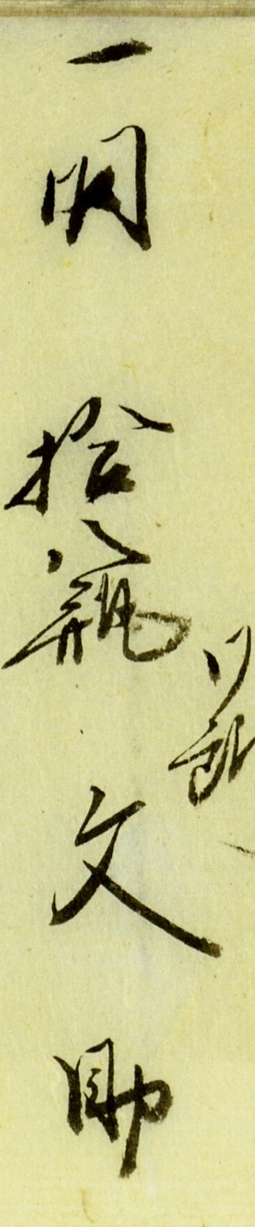一同拾八瓶文助
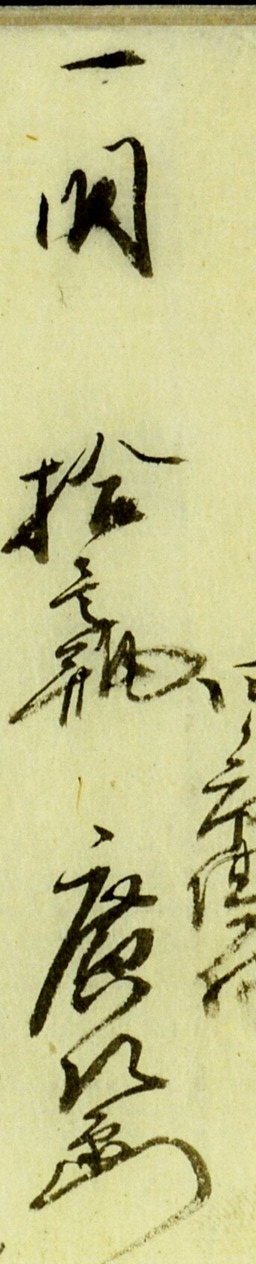一同拾壱瓶広左衛門
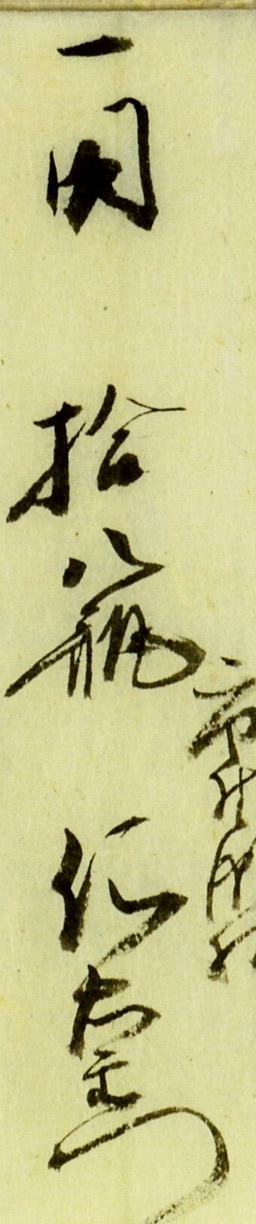一同拾八瓶仁右衛門
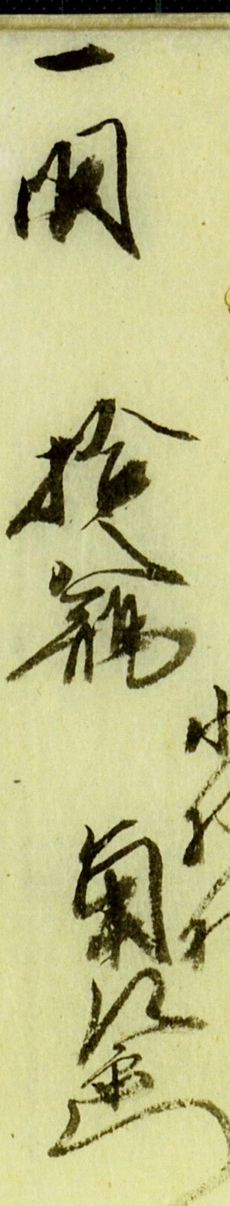一同拾八瓶角左衛門
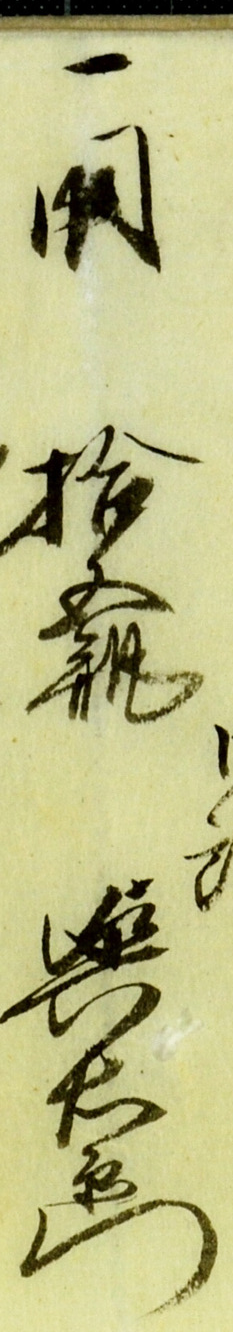一同拾五瓶与右衛門
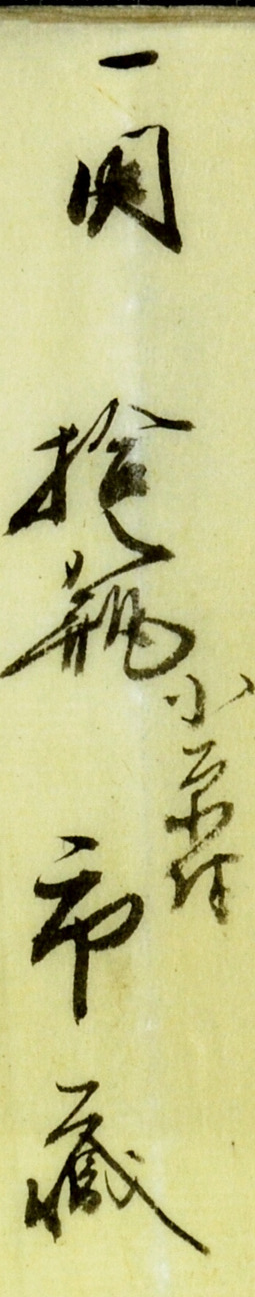一同拾八瓶市蔵

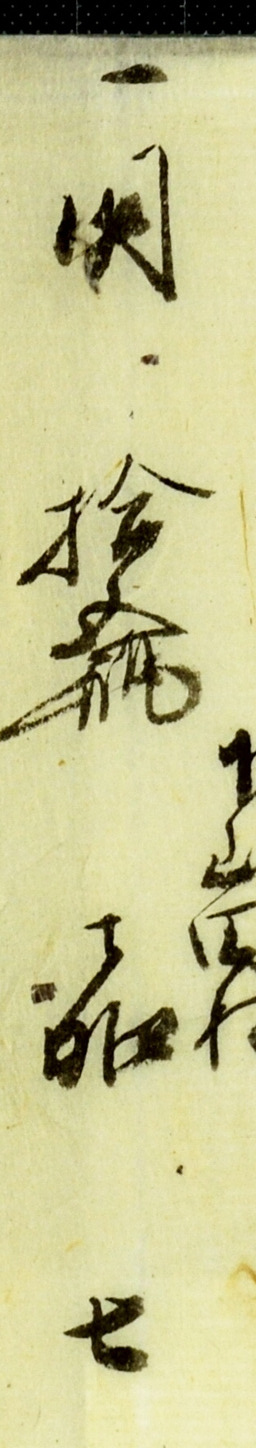一同拾五瓶嘉七
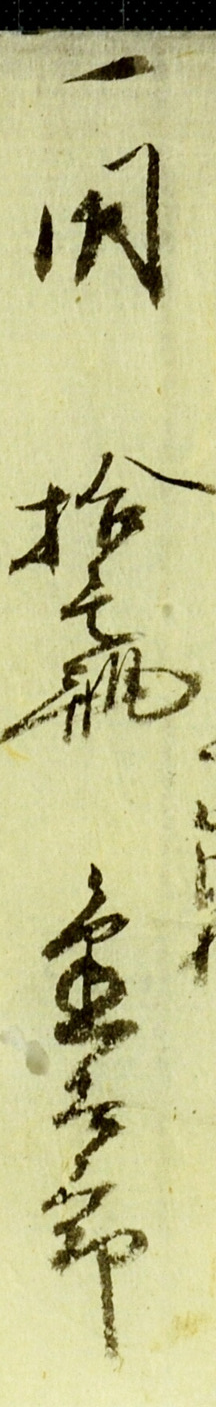一同拾壱瓶金太郎
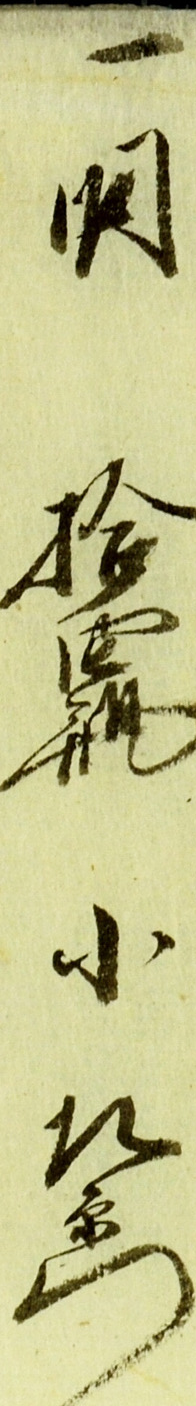一同拾四瓶小左衛門
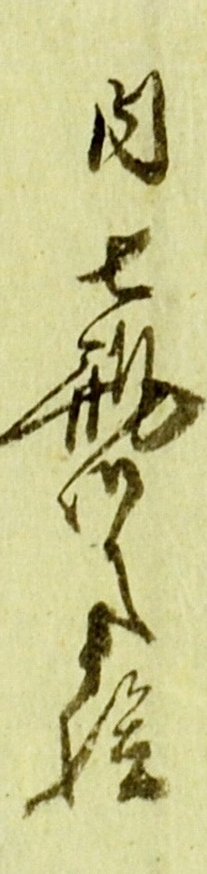内七瓶御用捨
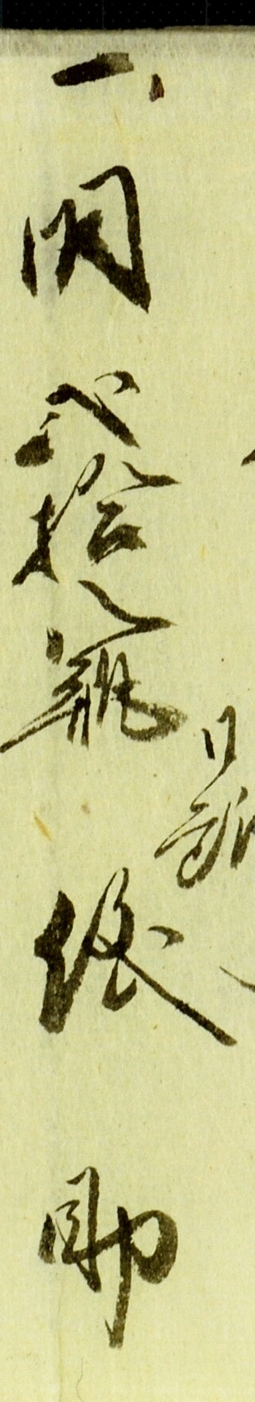一同弐拾八瓶儀助
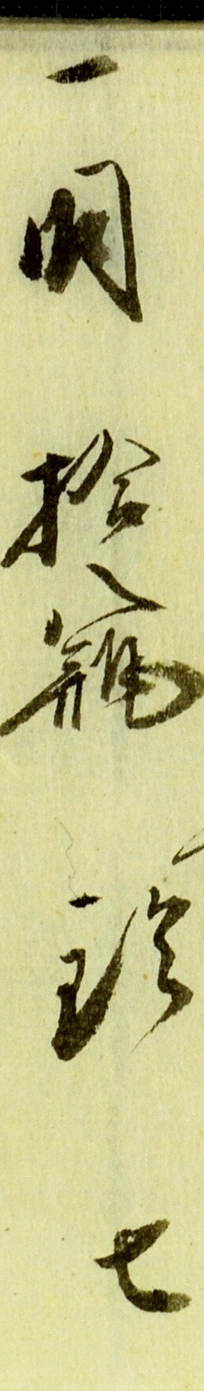一同拾八瓶鈴七
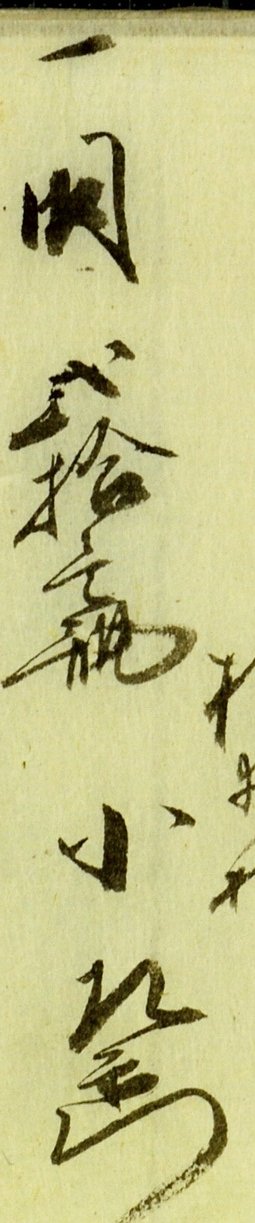一同弐拾壱瓶小左衛門
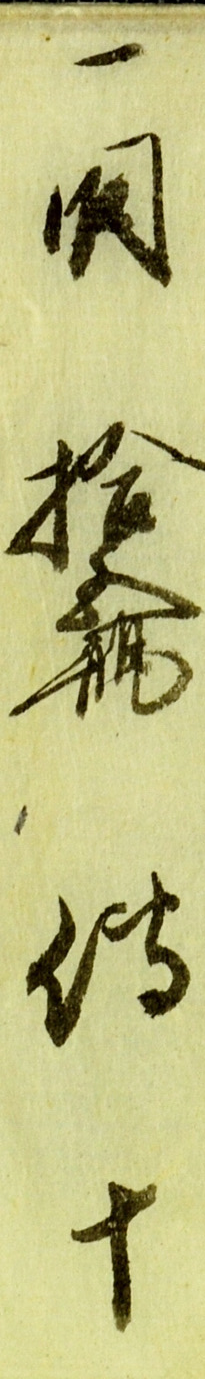一同拾五瓶伝十
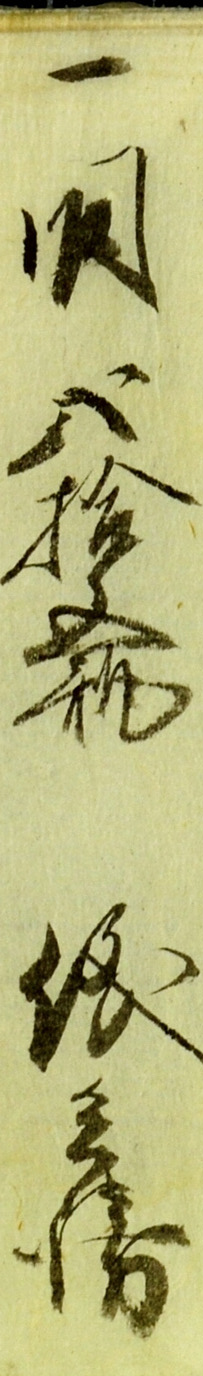一同弐拾五瓶儀兵衛
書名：御領分中御領分中紺屋藍瓶員数御改帳
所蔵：伊那市立高遠町図書館・合同会社AMANE
